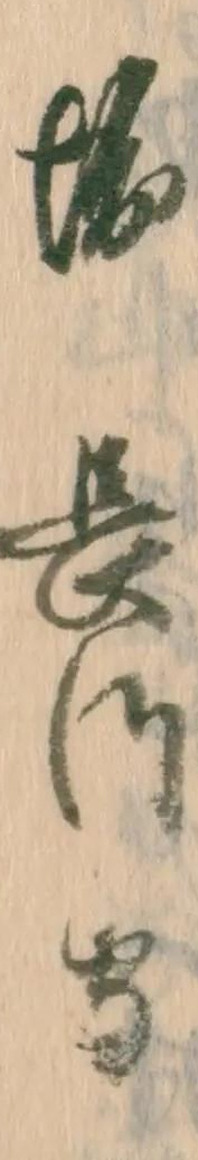堀長門守
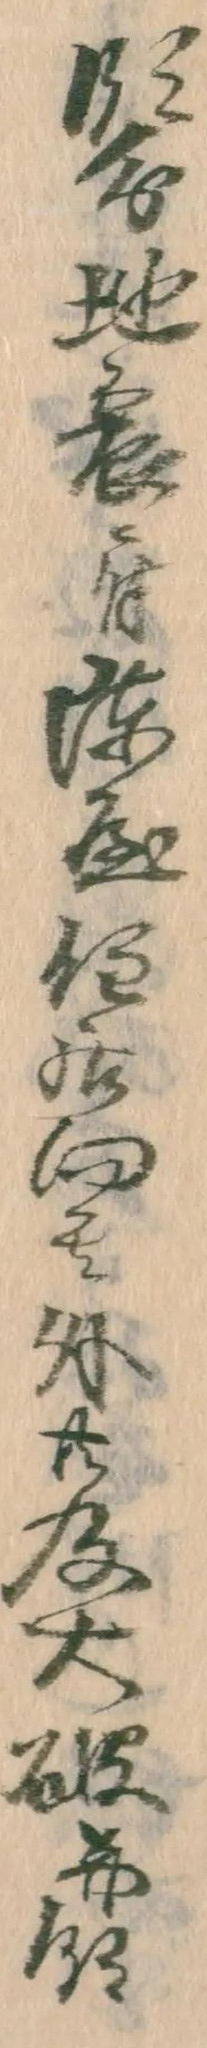領分地震二付陣屋住居向其外共及大破并領
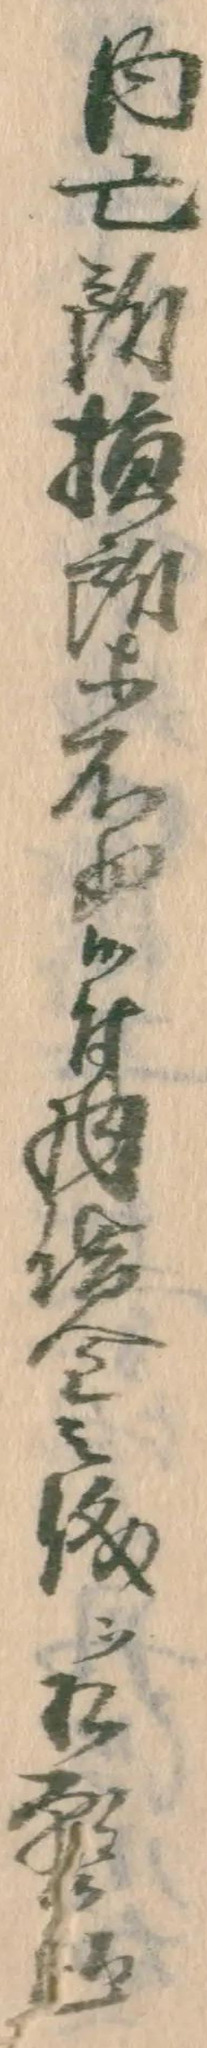内亡所損所等不少候付拝借之儀被相願候趣
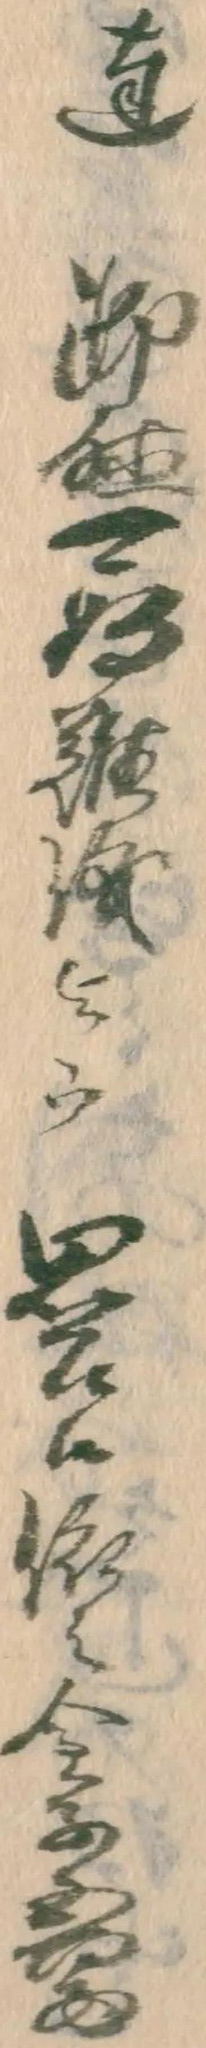達御聴可為難儀と被思召候依之金子五百両
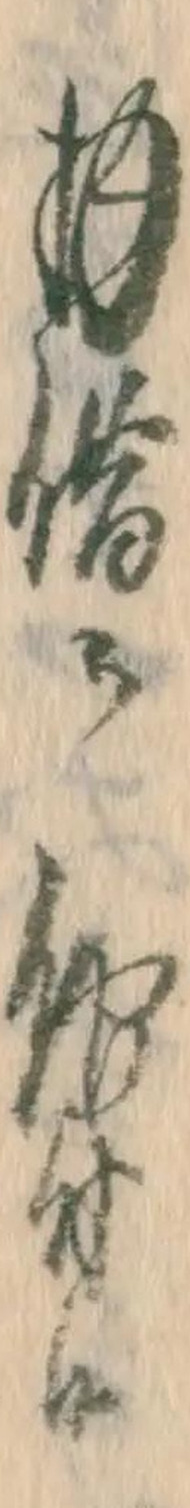拝借被仰付
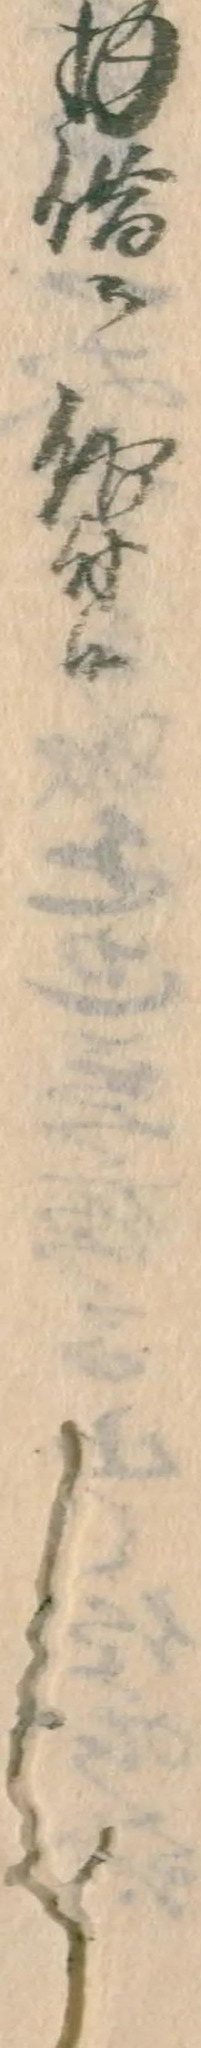拝借被仰付
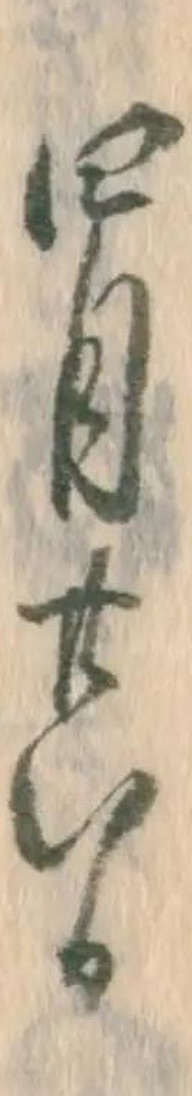四月廿八日
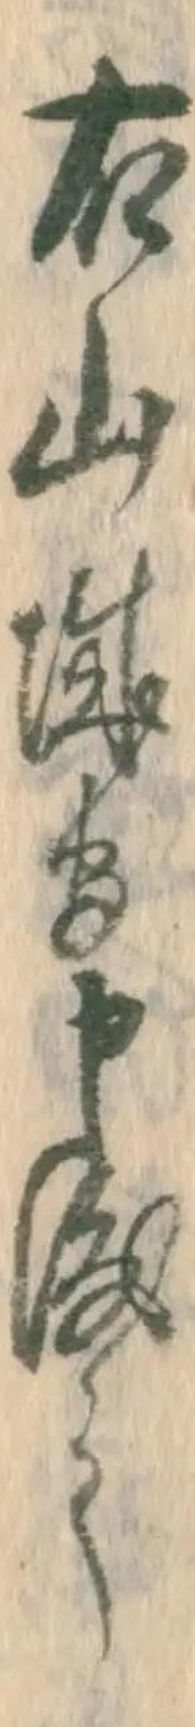右山城守申渡之

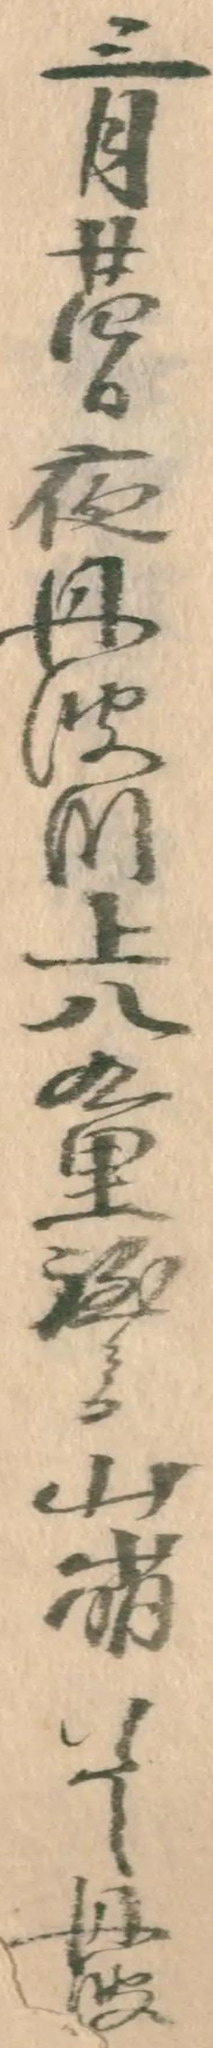三月廿四日夜丹波川上八九里程二而山崩いたし丹波
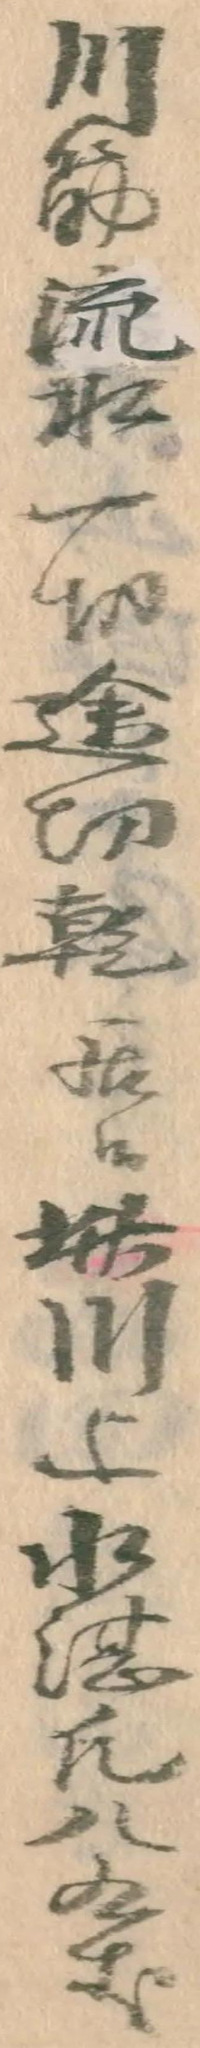川筋流水一切途切乾居候此川上水湛凡八九丈
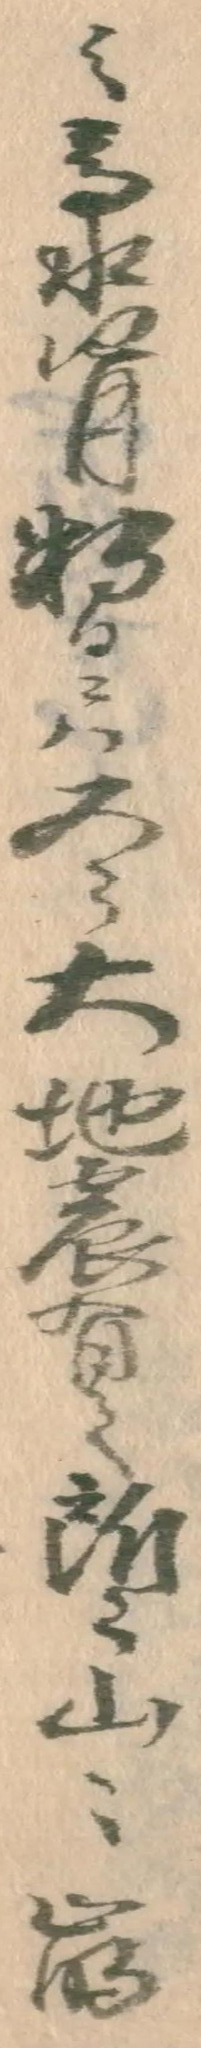之高水四月朔日二ハ又々大地震有之折々山々崩
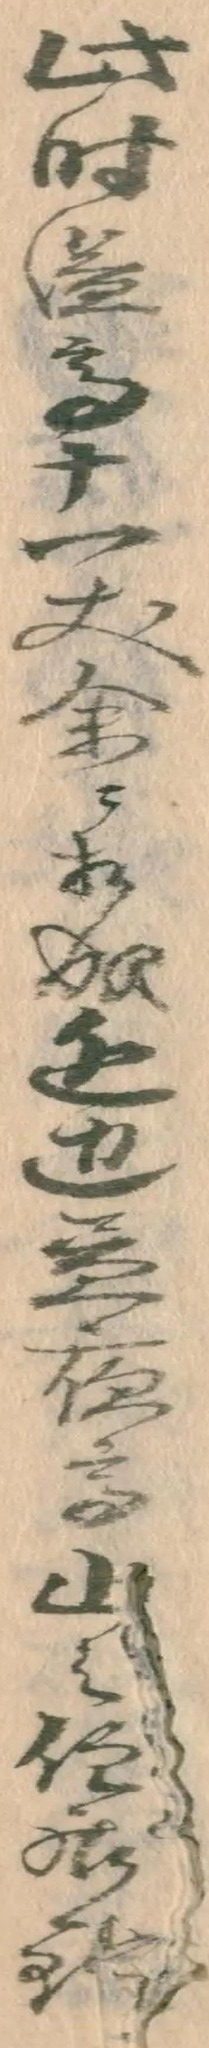此時溢高十一丈余二相成近辺昼夜高山之住居致
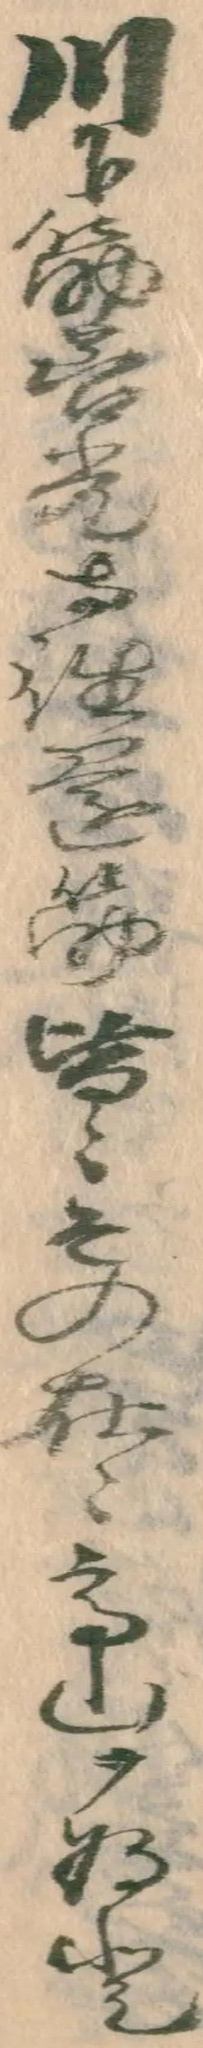川下筋善光寺往還筋皆々その在々高山ヲ為登
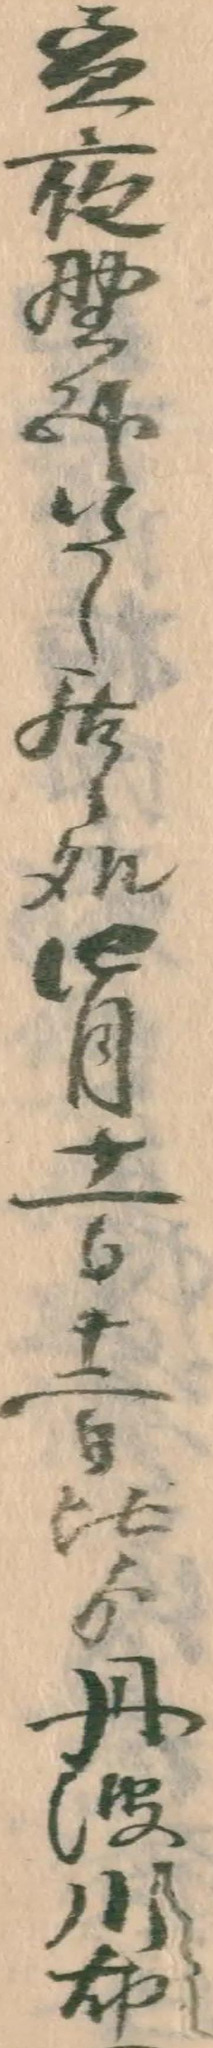昼夜野臥いたし居候処四月十一日十二日比ゟ丹波川筋へ
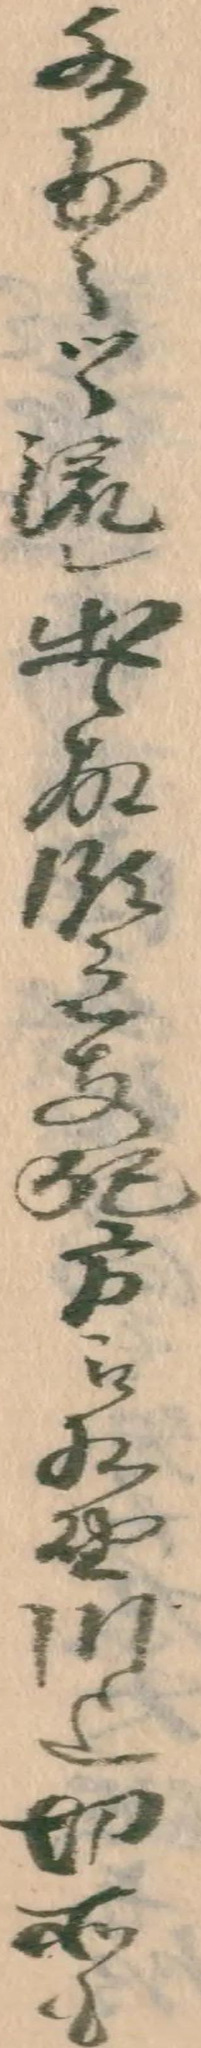水少々ツ丶流レ出候故瀬立之支配方江水出川上切所も
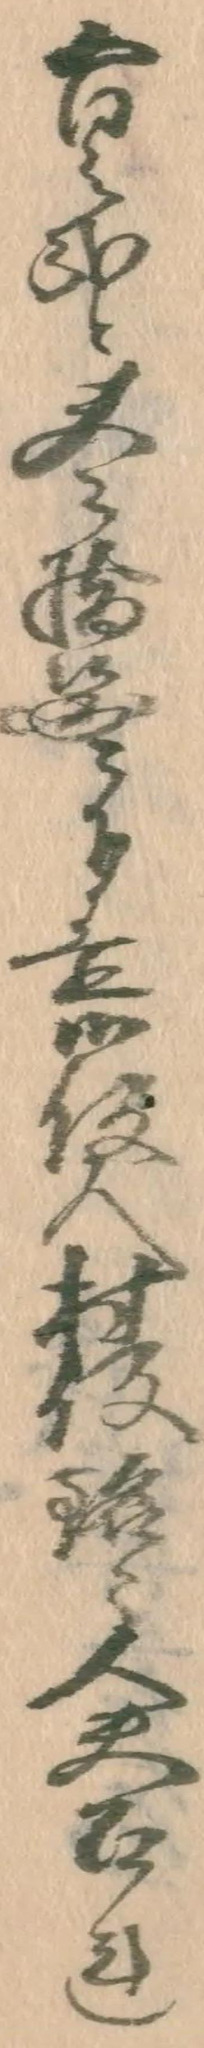有之哉と夫々指図二下置御役人村役銘々人夫召連
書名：信州大地震之記
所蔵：国立国会図書館 National Diet Library, JAPAN
